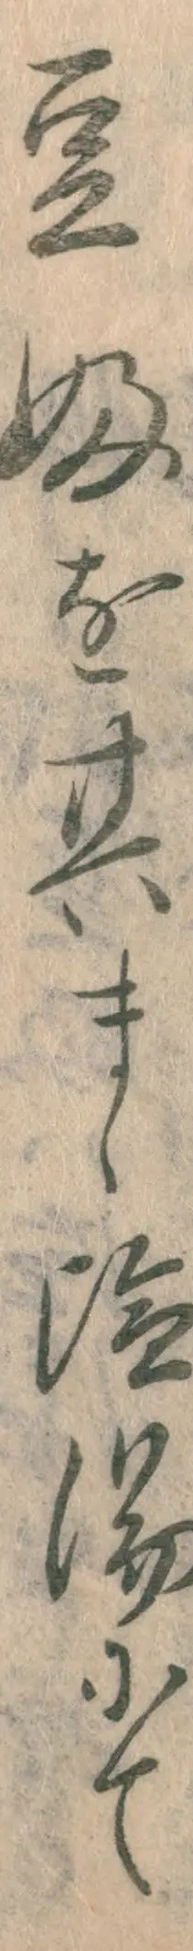豆ふを其まゝ塩湯にて
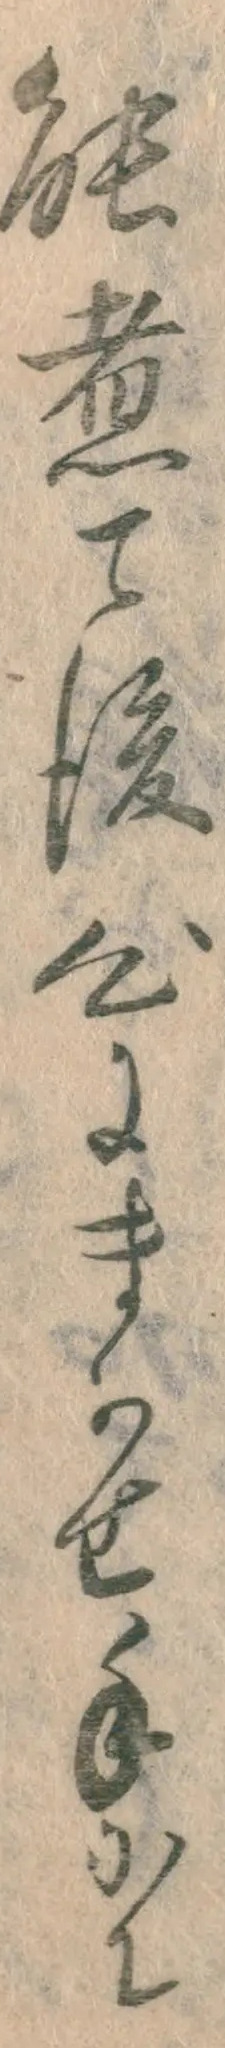能煮て後心にまかせ手にて
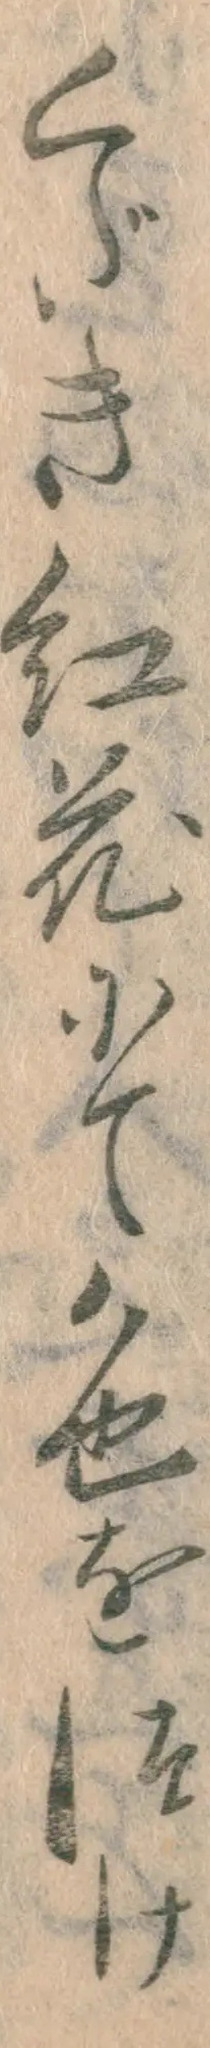くだき紅花にて色をつけ
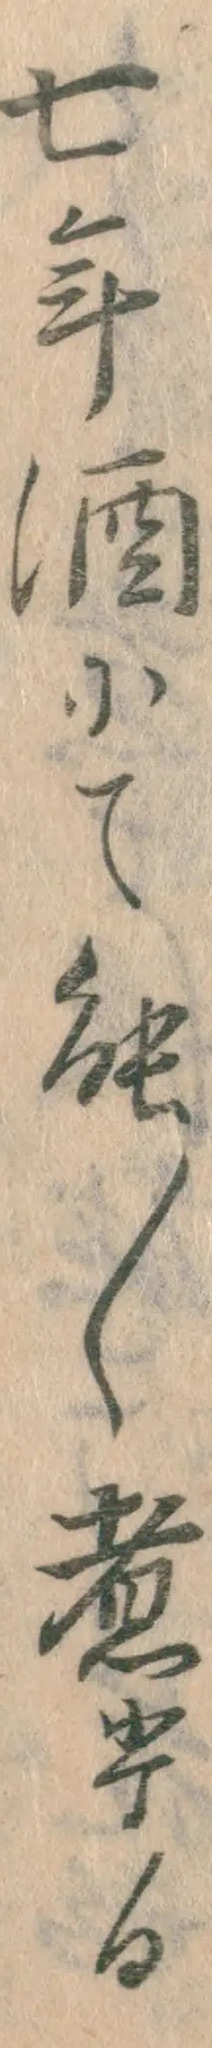七年酒にて能〳〵煮たる
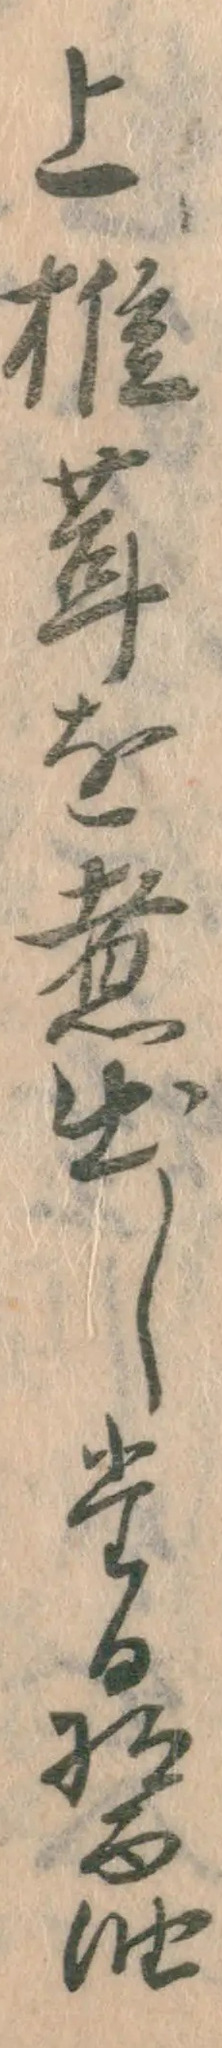上椎茸を煮出したる醤油
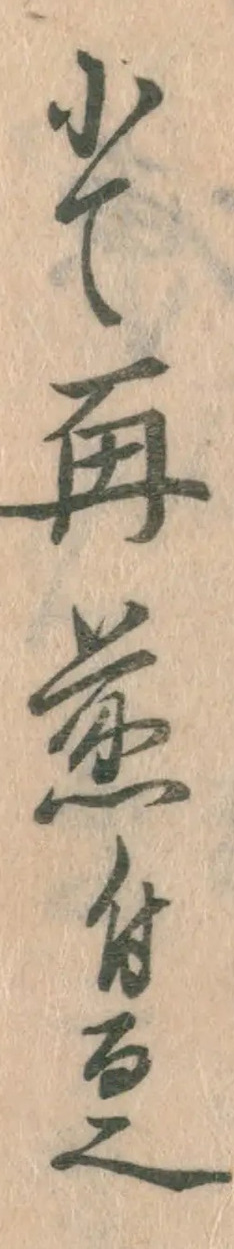にて再煎付る也
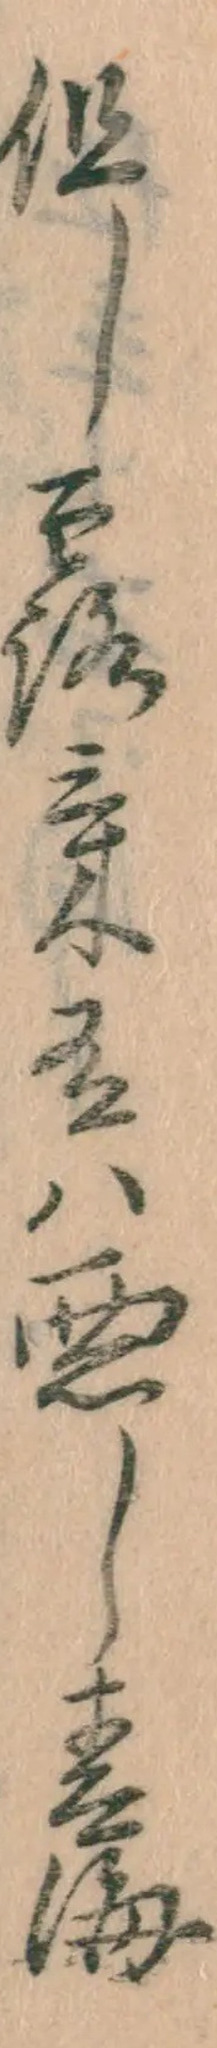但し露気有は悪し青海
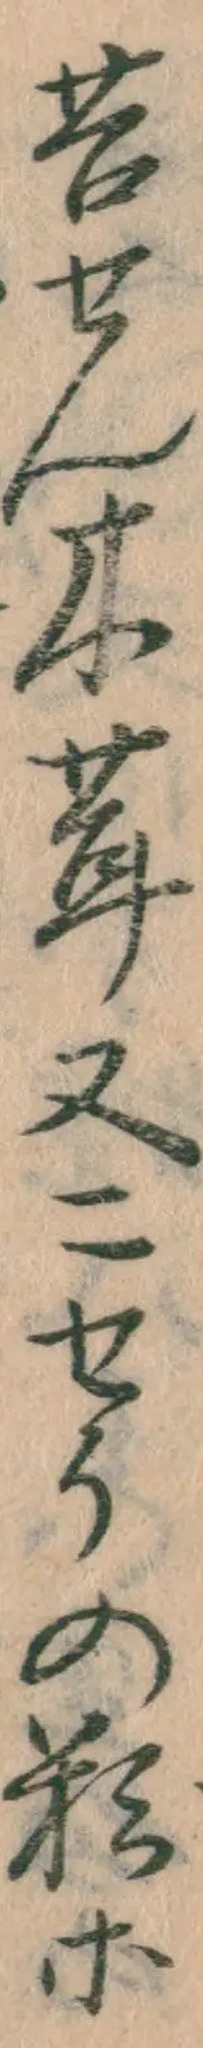苔せん木茸又こせうの粉等
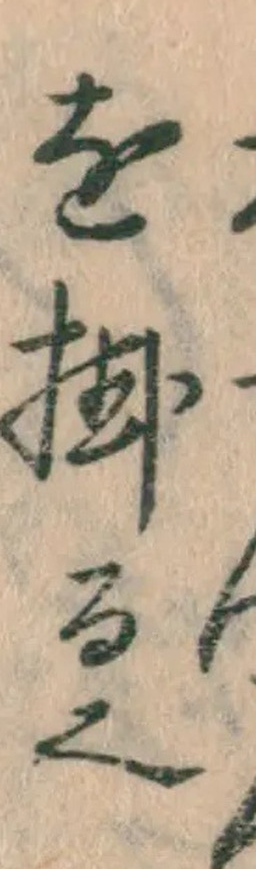を掛る也
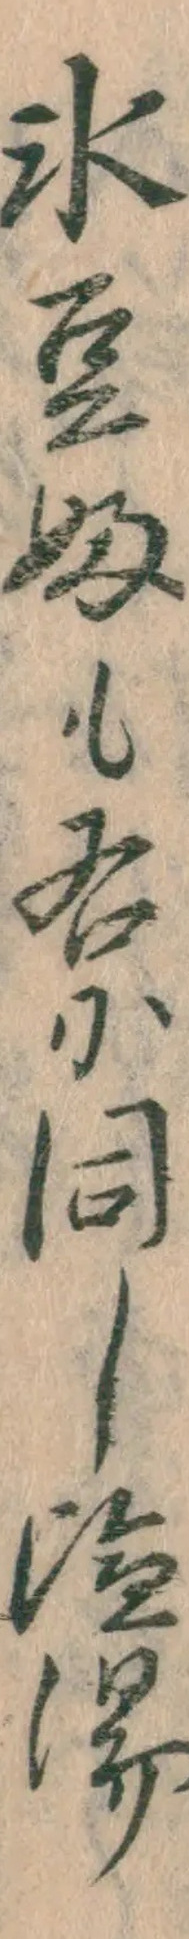氷豆ふも右に同し塩湯
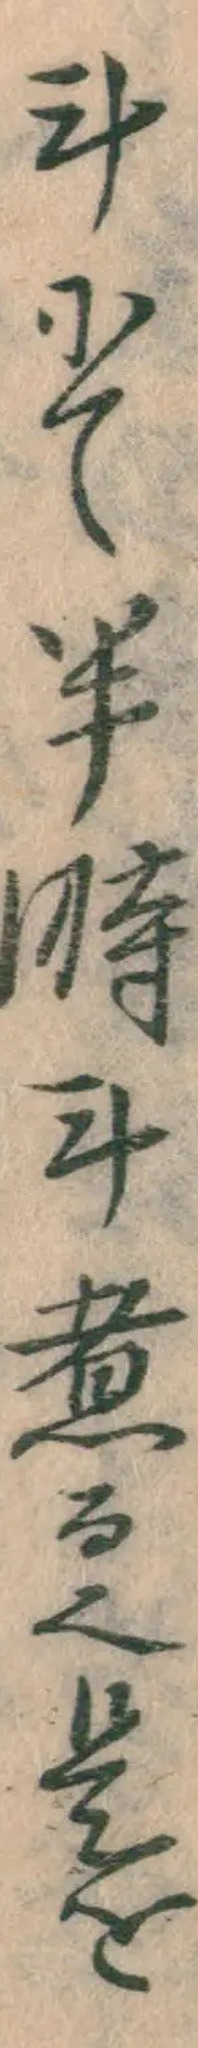斗にて半時斗煑る也是を
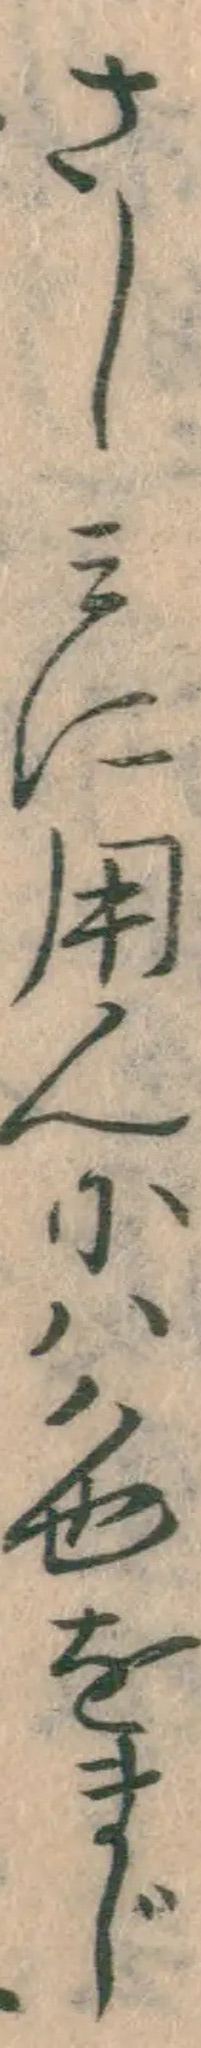さしみに用んには色をまじ
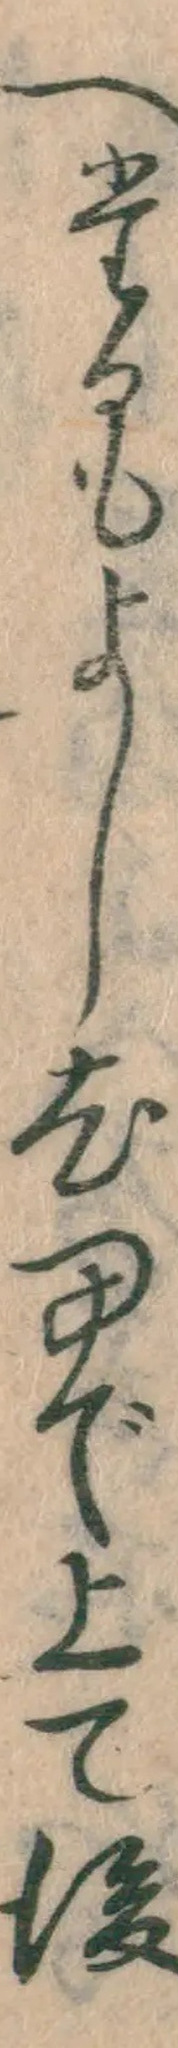へたるもよし尤ゆで上て後
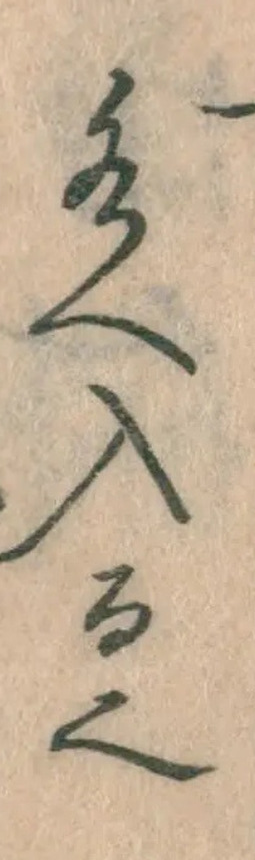水へ入る也
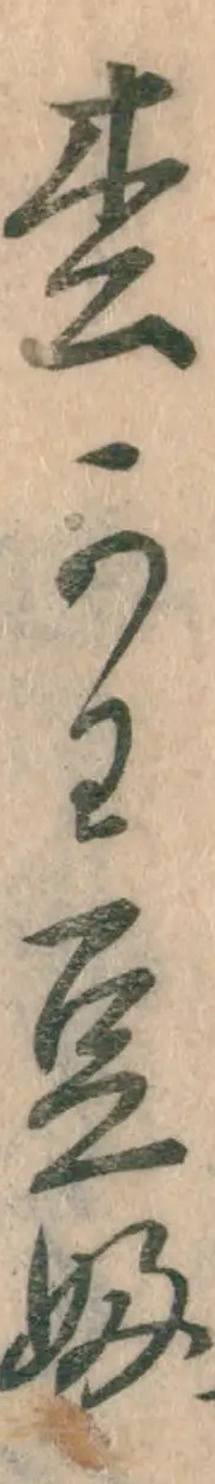松かわ豆ふ
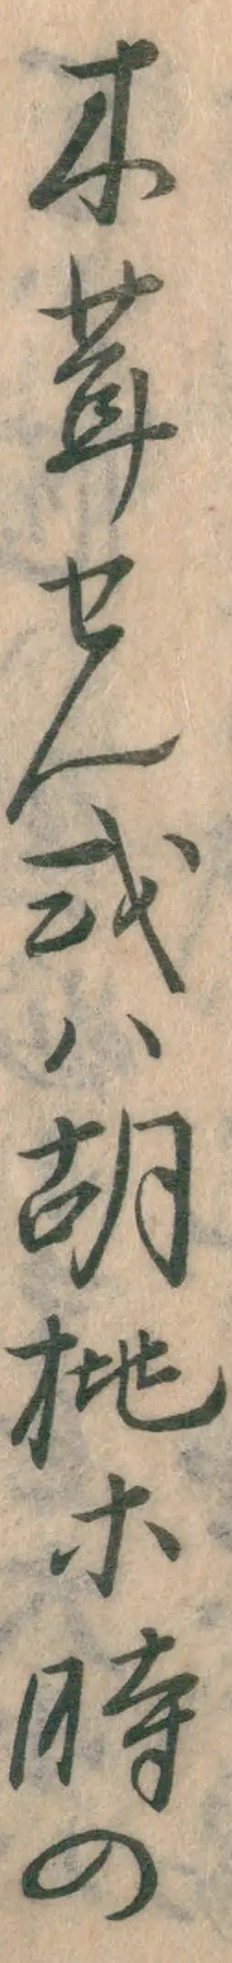木茸せん或は胡桃等時の
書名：豆腐百珍余録
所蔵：国立国会図書館 National Diet Library, JAPAN
